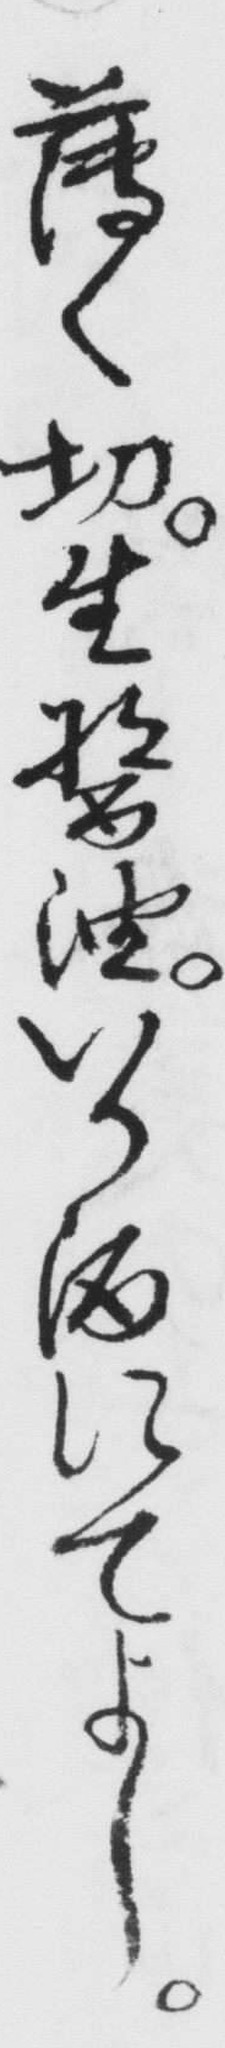○薄く切。生醤油。いり酒にてよし。
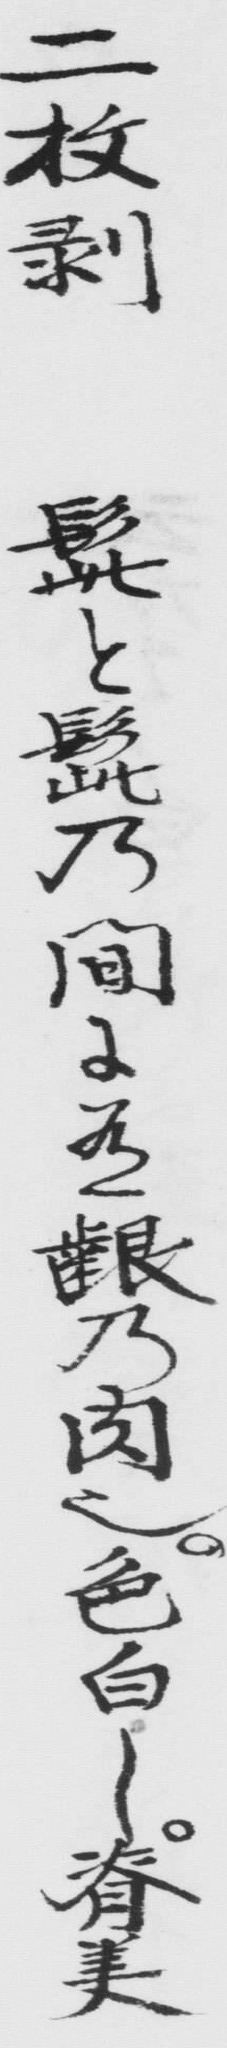二枚剥髭と髭の間に有齦の肉也。色白し。背美
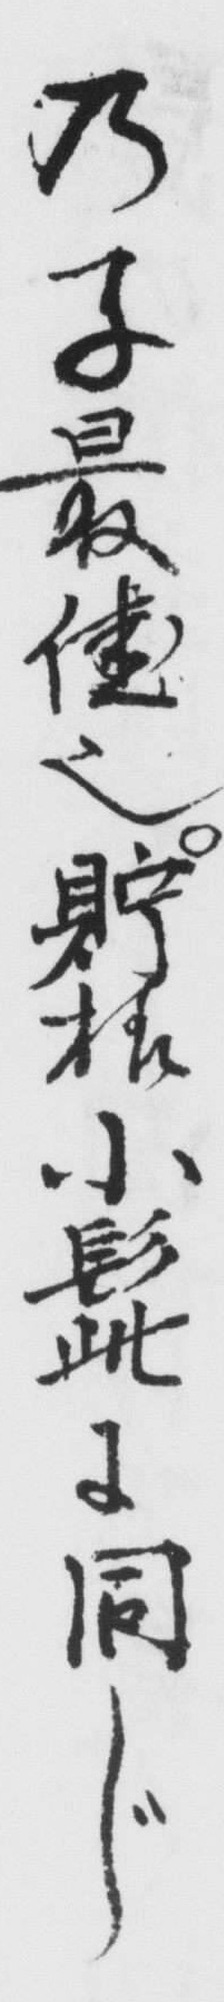の子最佳也。貯様小髭に同じ
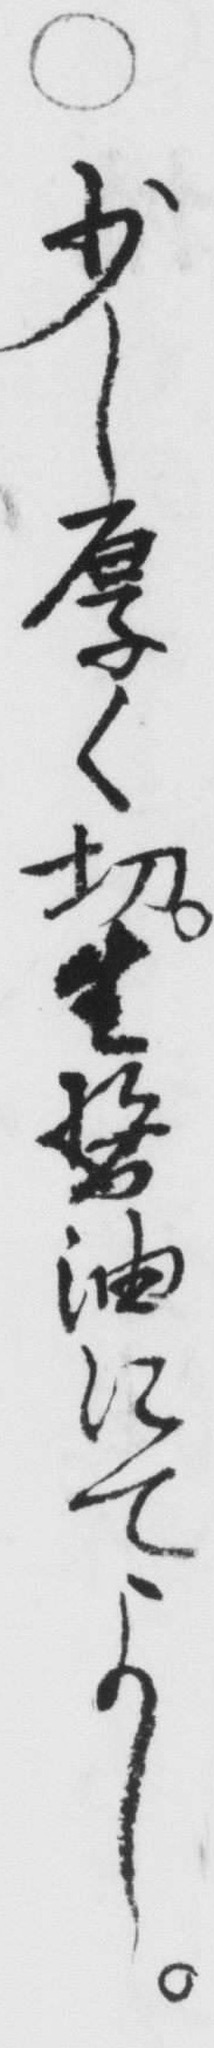○少し厚く切。生醤油にてよし。

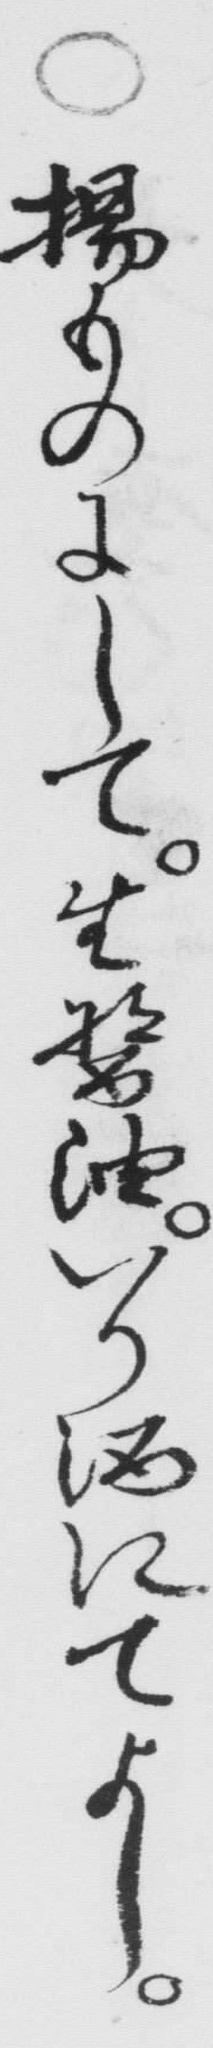○揚ものにして。生醤油。いり酒にてよし。
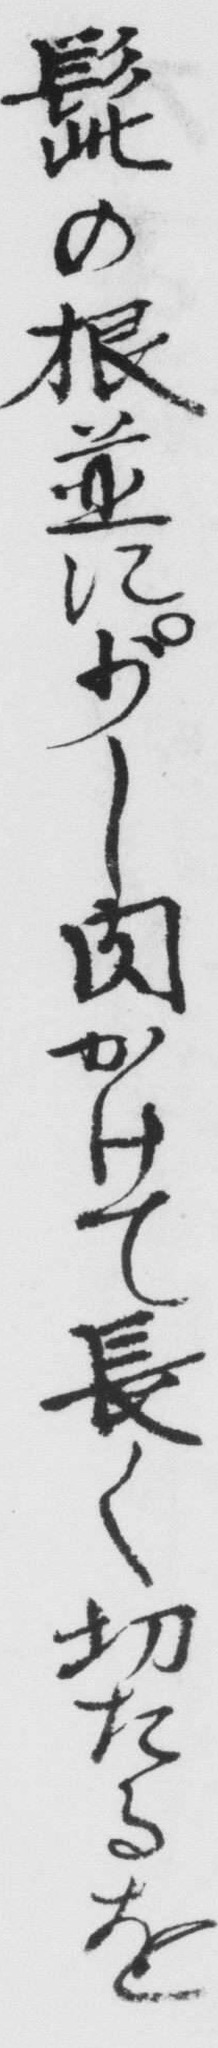圓羽髭の根並に。少し肉かけて長く切たるを
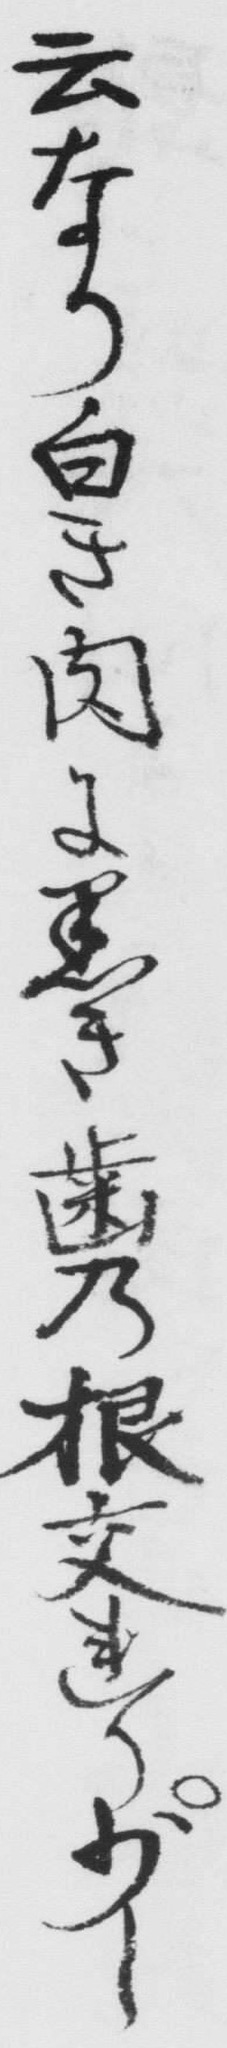云なり。白き肉に黒き歯の根交れり。少し
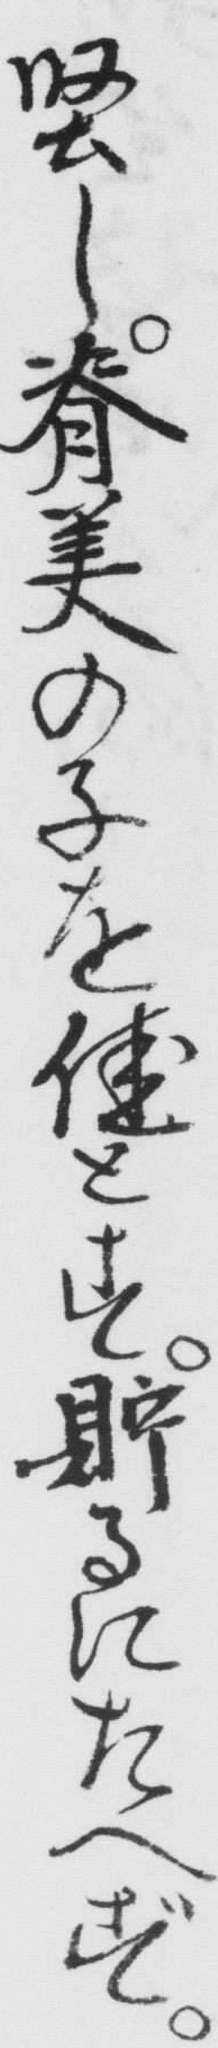堅し。背美の子を佳とす。貯るにたへず。
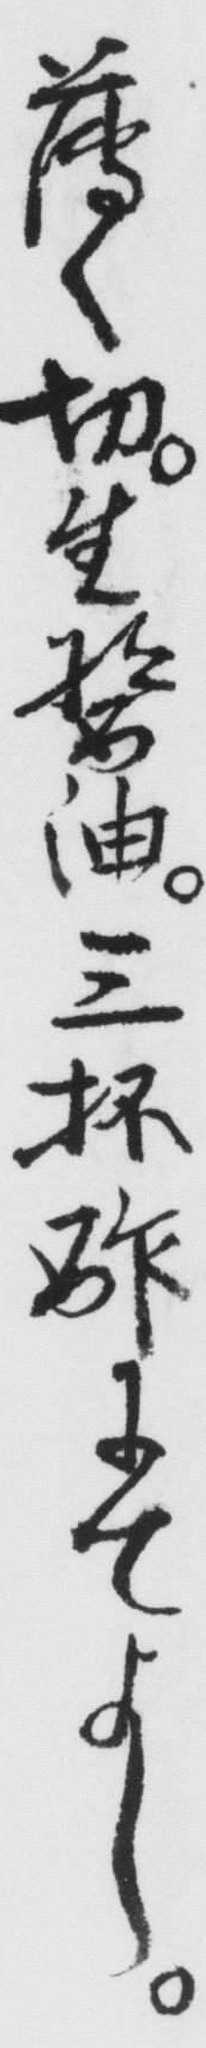○薄く切。生醤油。三杯酢にてよし。
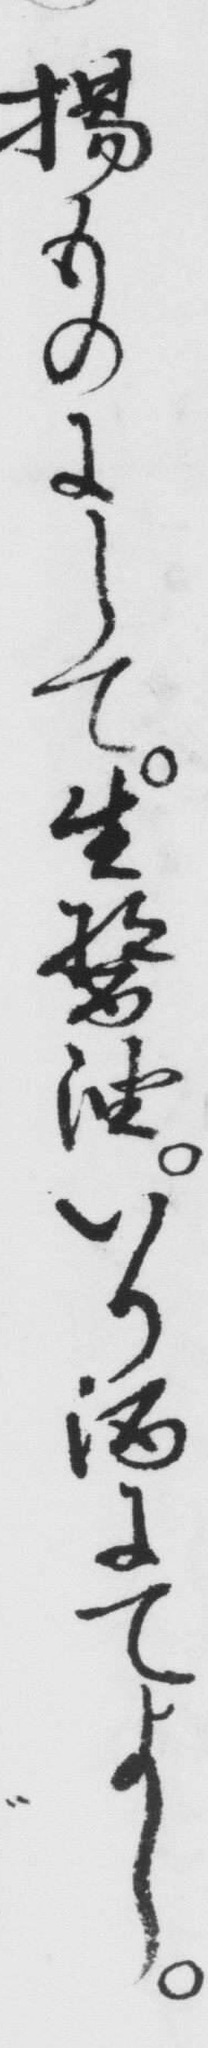○揚ものにして。生醤油。いり酒にてよし。
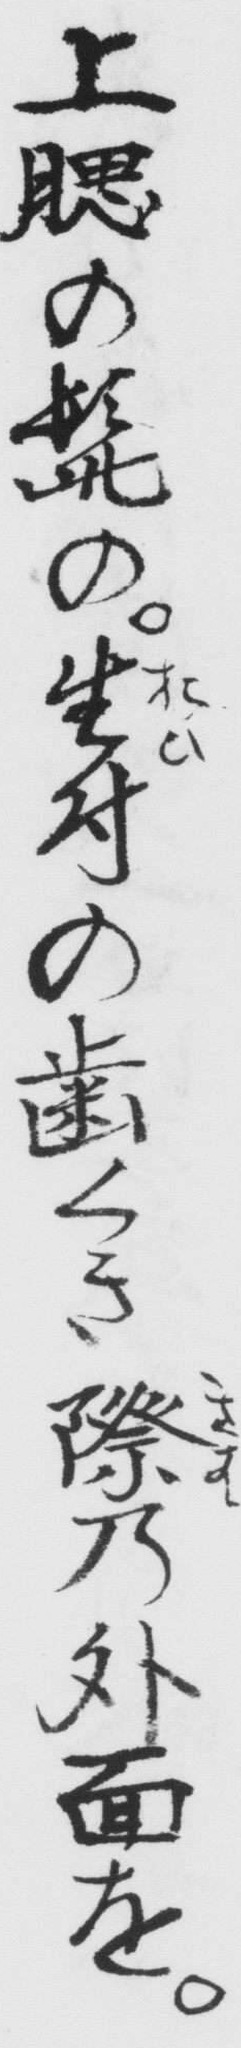ウナギ上腮の髭の。生付の歯くき際の外面を。
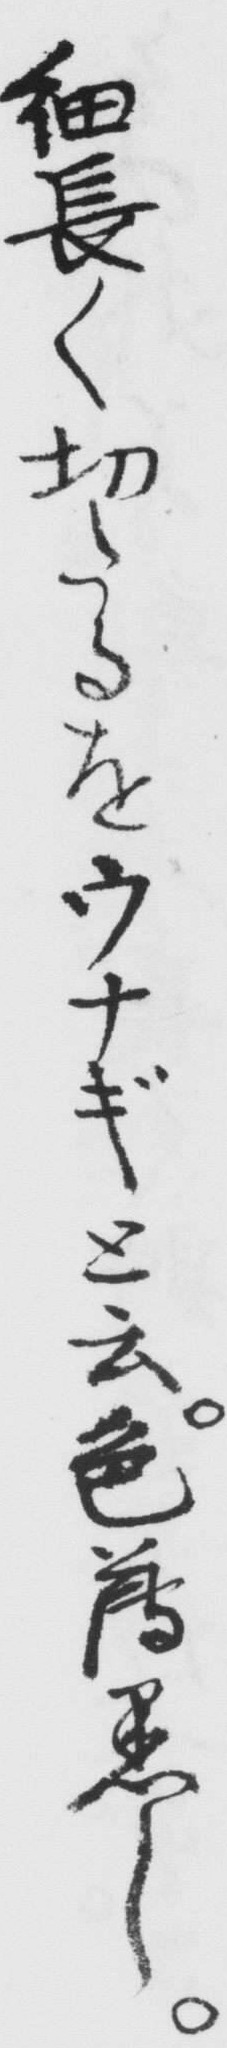細長く切たるをウナギと云。色薄黒し。
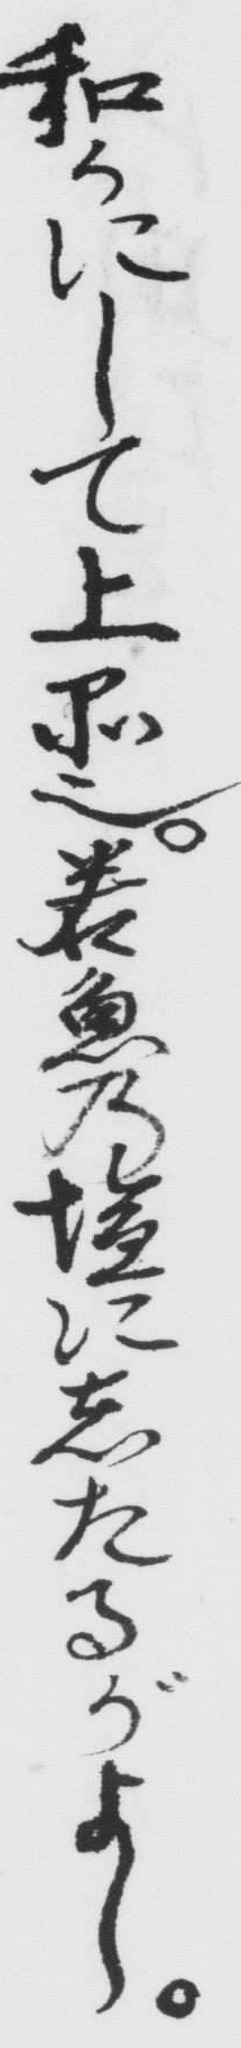和かにして上品也。若魚の塩にしたるがよし。
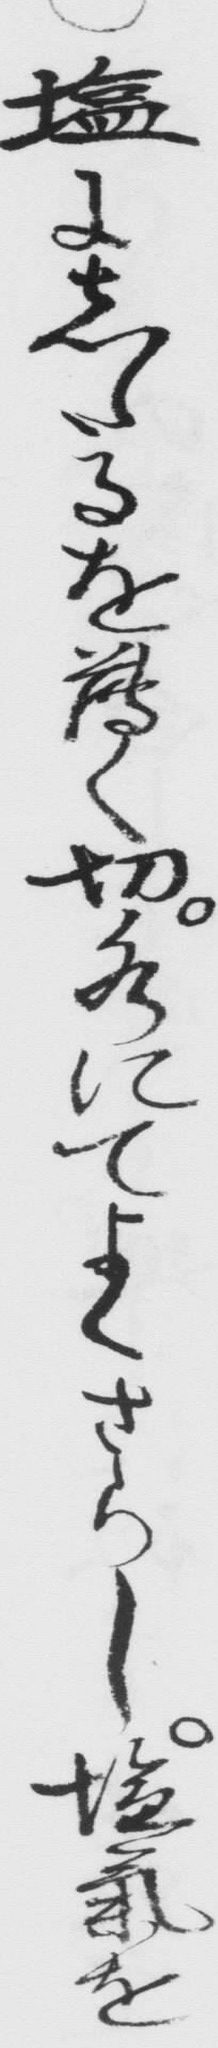○塩にしたるを薄く切。水にてよくさらし。塩気を
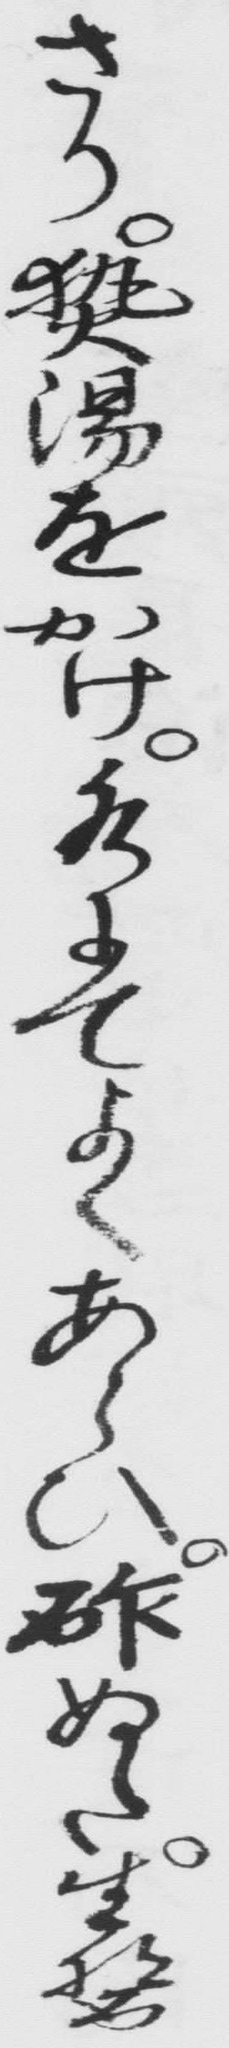さり。熱湯をかけ。水にてよくあらひ。酢ぬた。生醤
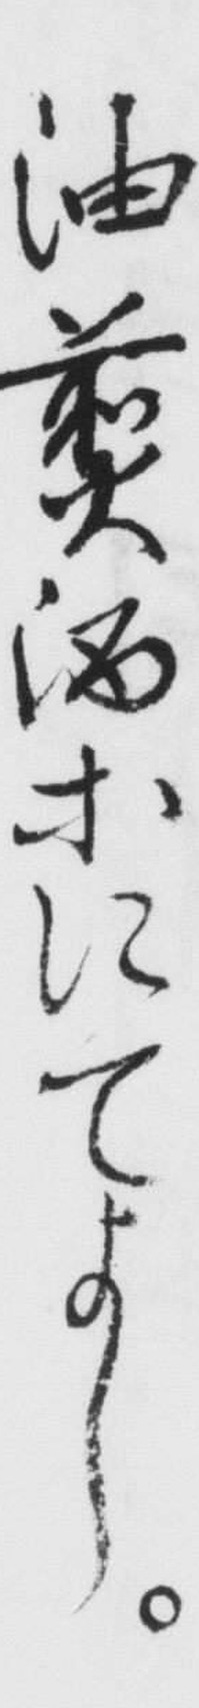油煎酒等にてよし。
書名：鯨肉調味方
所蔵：大阪府立大学学術情報センター 国文学研究資料館
